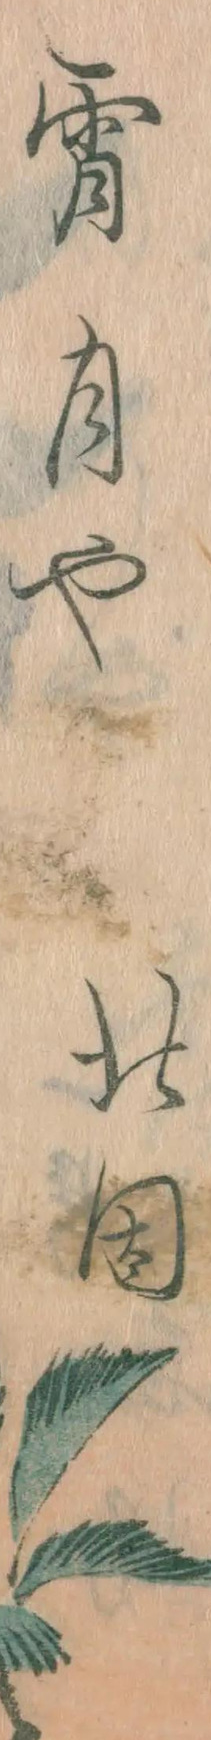雪月や北固

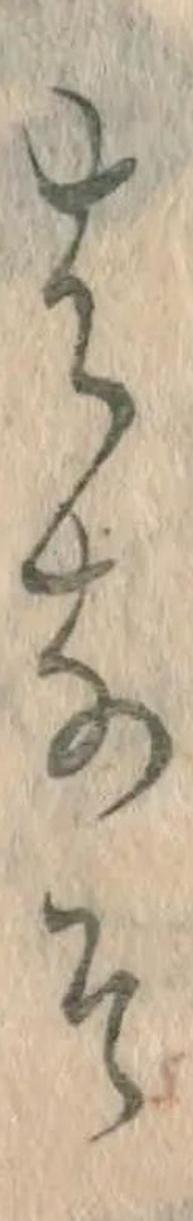はなそ
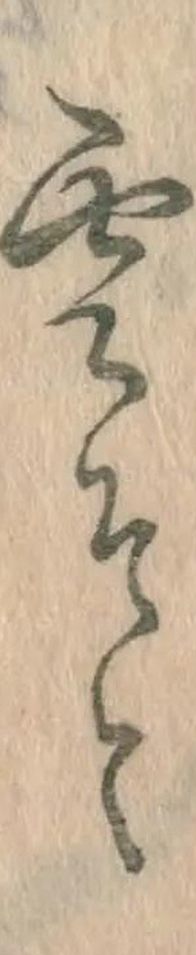雲そと
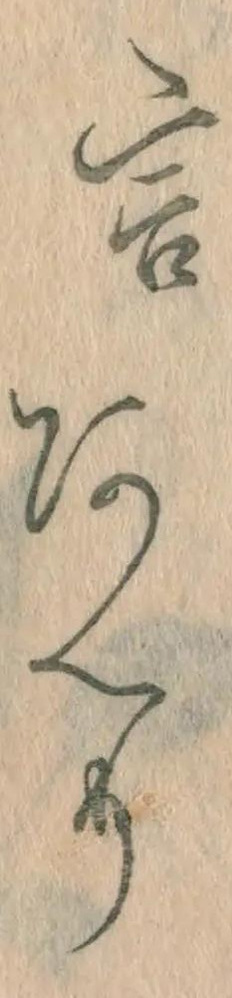あへり
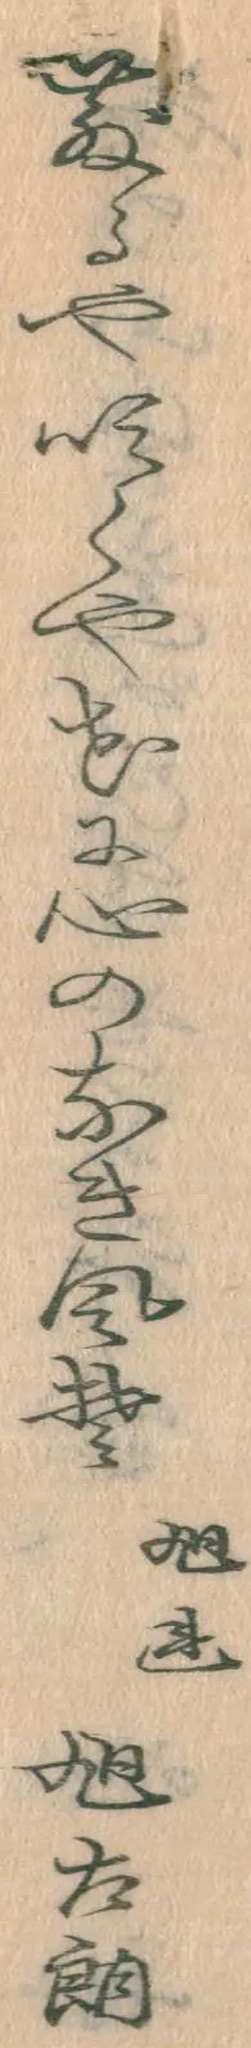吹ぬるや咲くや世に心のなき風旭旭左朗
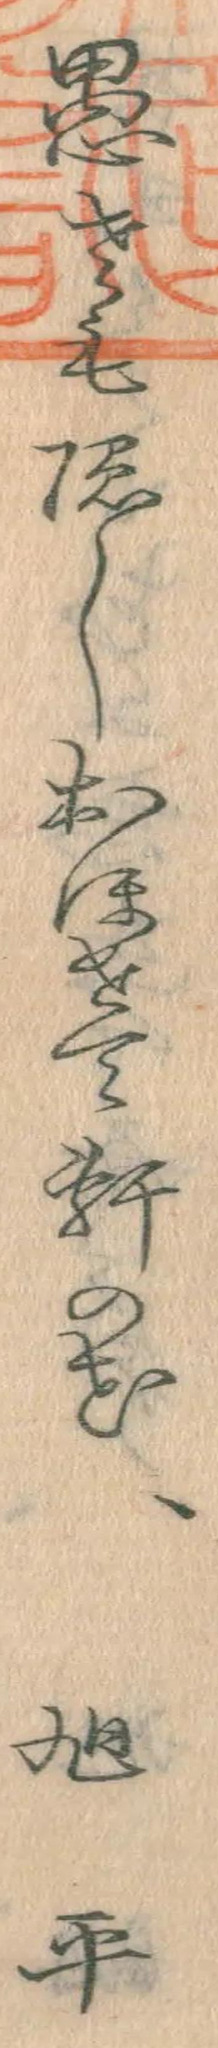愚よも隠しおほせて粋の花旭平
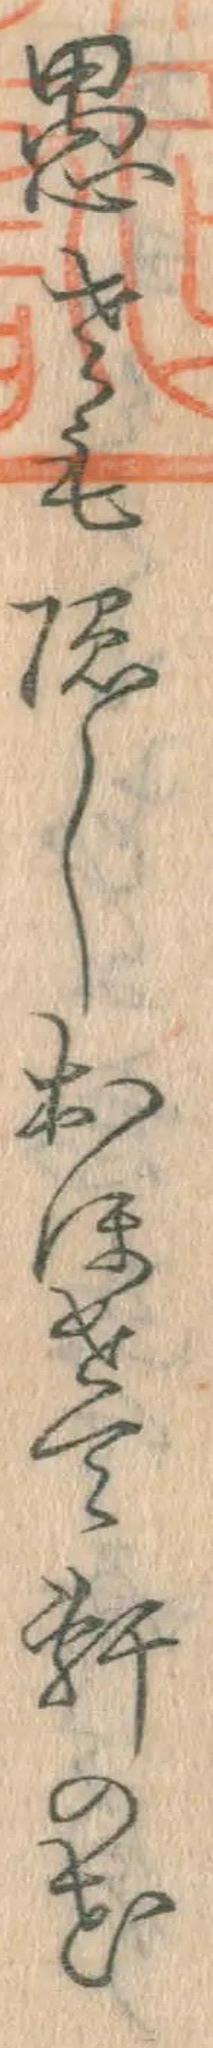愚よも隠しおほせて粋の花旭平
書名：桜帖
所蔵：国立国会図書館 National Diet Library, JAPAN
